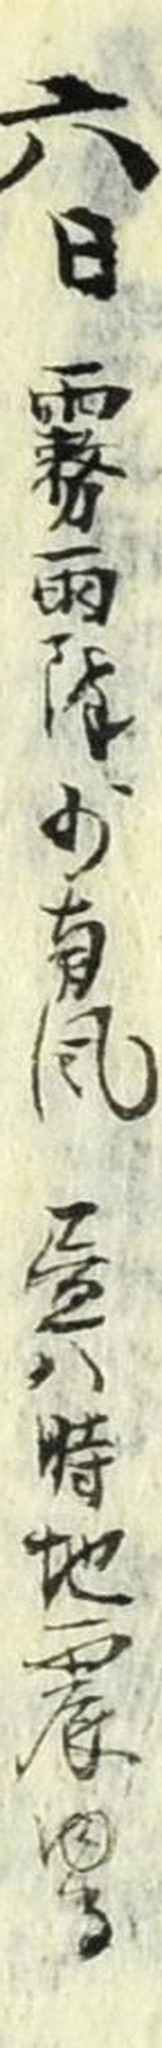六日霧雨降少南風昼八時地震ゆる
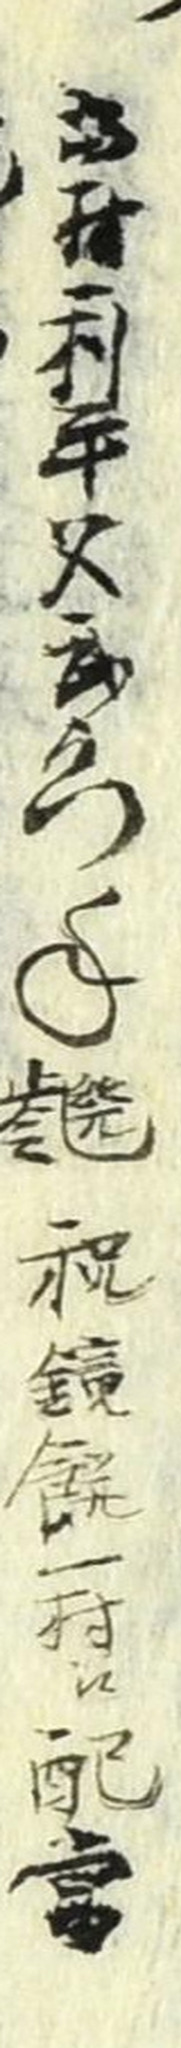当村利平父武右衛門年齢祝鏡餅一村江配当
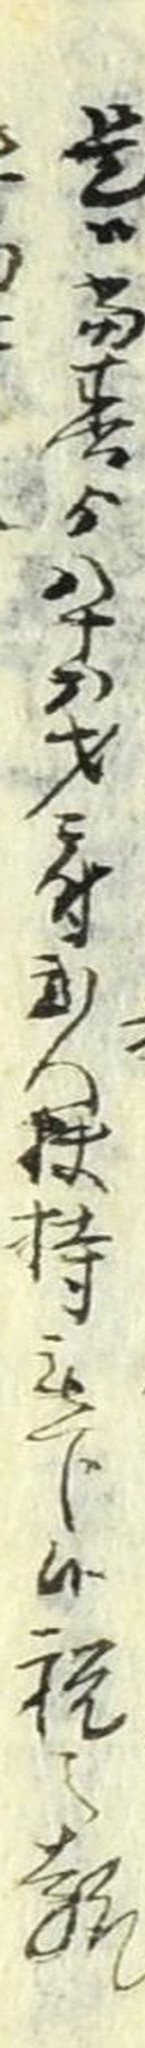是ハ当春ゟ八十六才に付弐人扶持被下候祝之趣
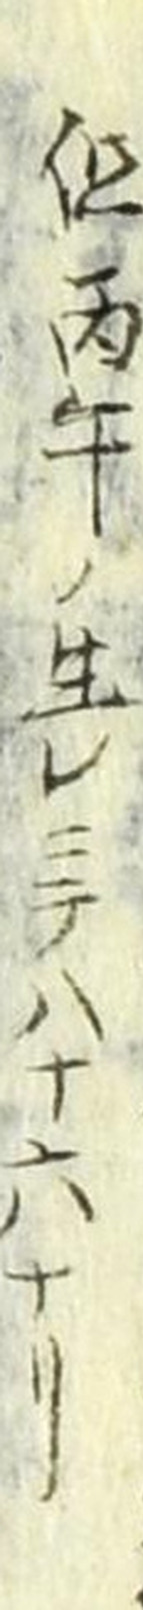但丙午ノ生レニテ八十六なり
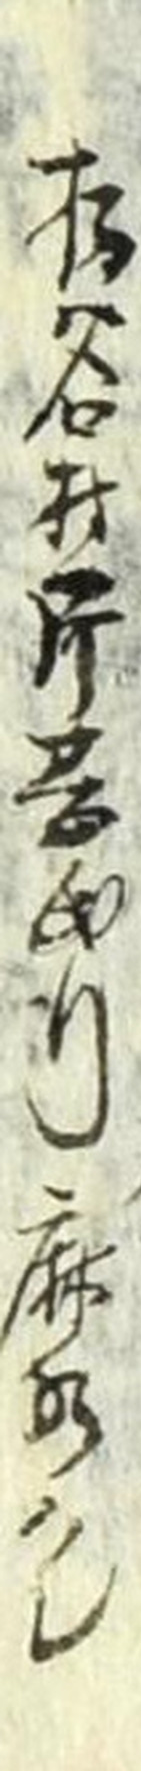栃谷村片岡氏行麻水クレ
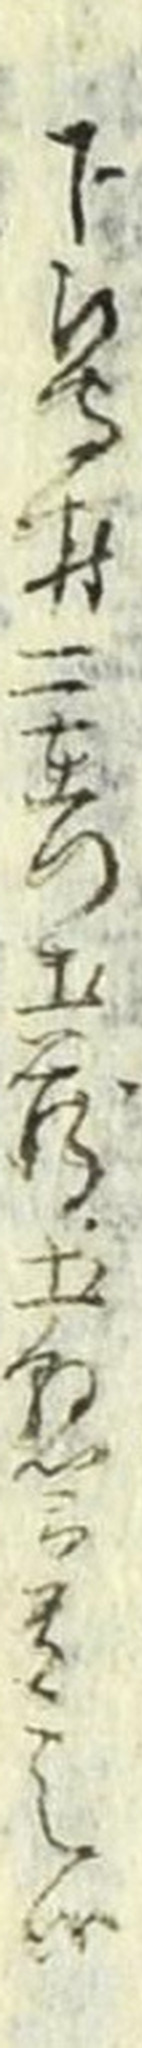下江守村ニ在門土蔵土懸ニ而有之候
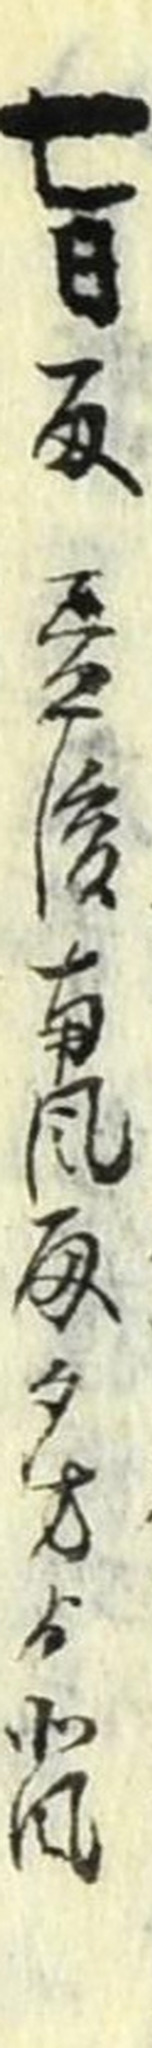七日雨昼後南風雨夕方ゟ北風
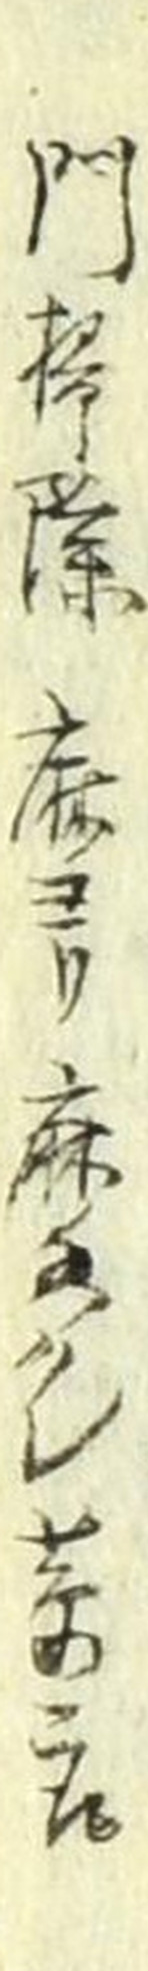門掃除麻ヨリ麻水クレ草取

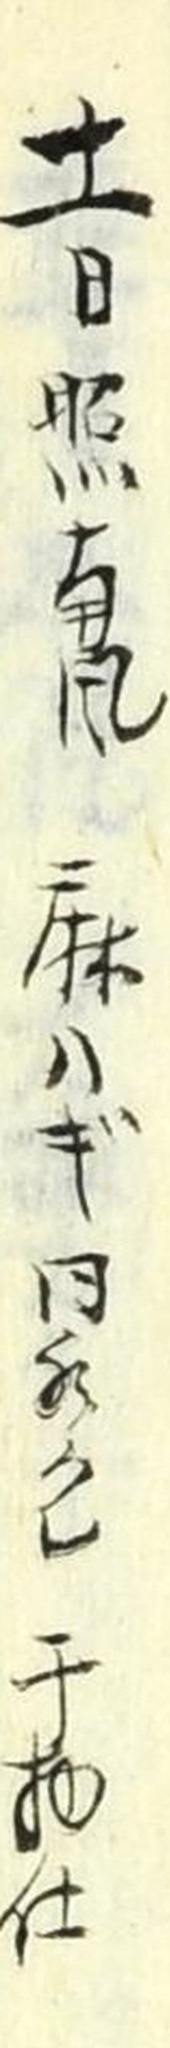十一日照南風麻ハギ同水クレ干物仕
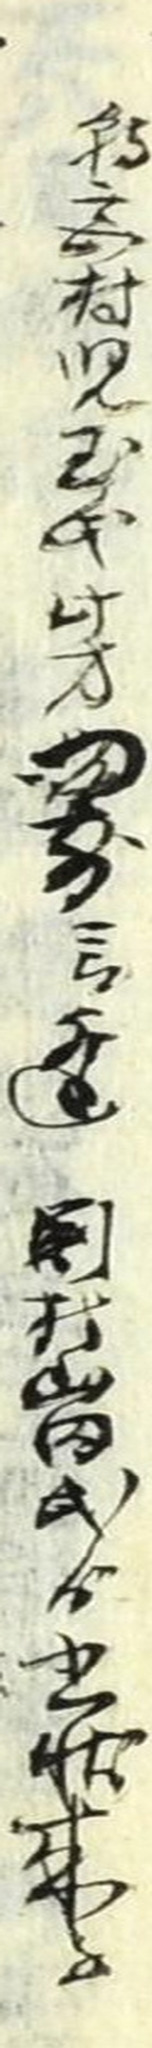朝宮村児玉氏此方門前ニ而逢関村山内氏ゟ書状来る
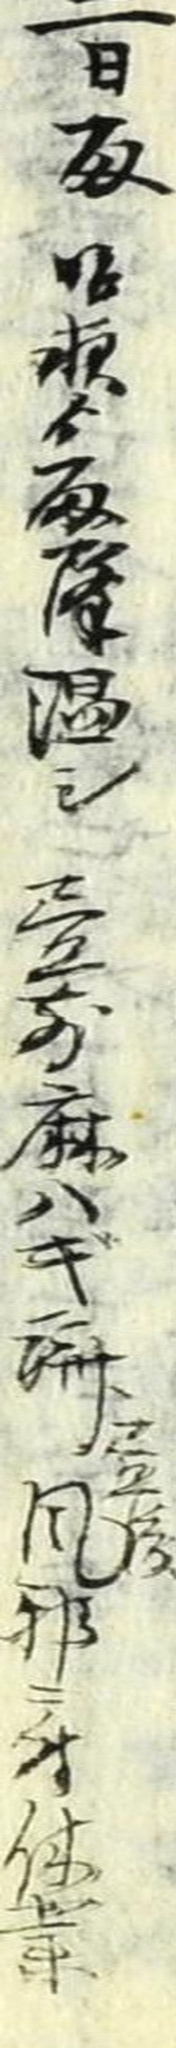十二日雨昨夜ゟ雨降温シ昼前ハギ済昼後風邪ニ付休業
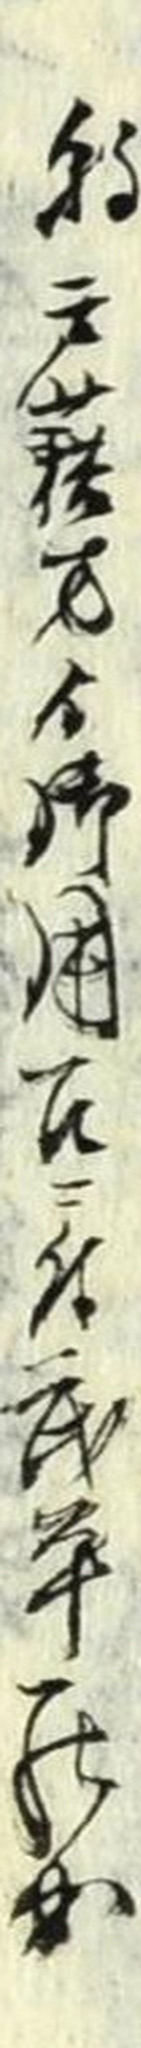朝戸籍方ゟ御用召ニ付茂平罷出
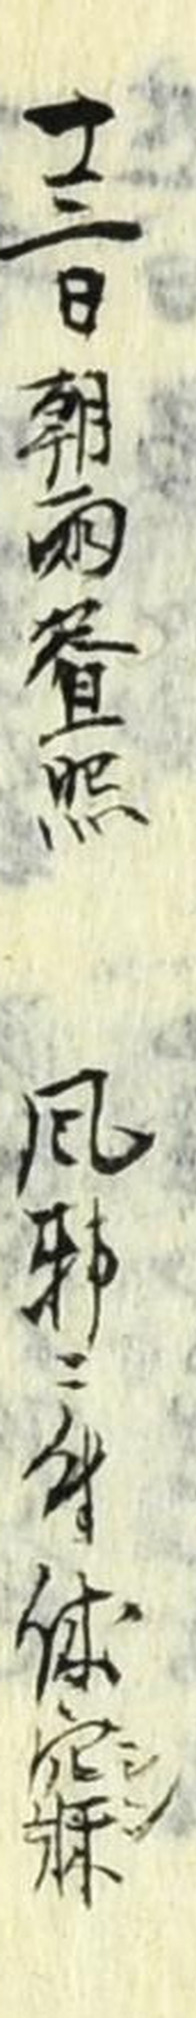十三日朝雨昼照風邪ニ休寝
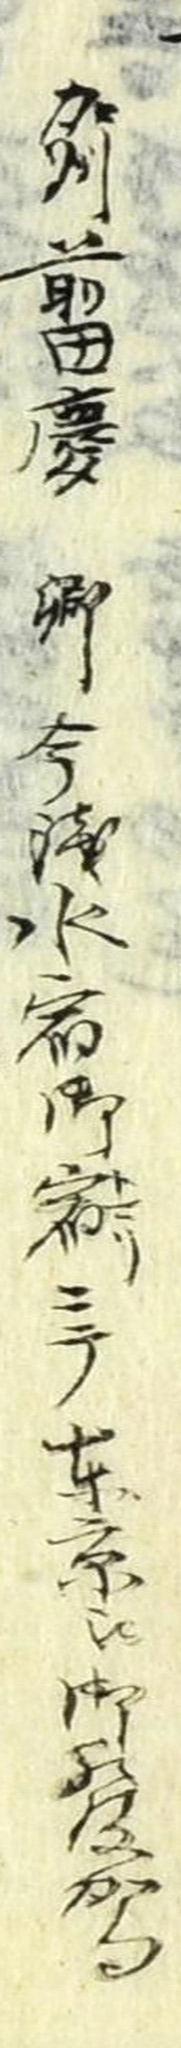加州前田慶卿今浅水宿御宿ニテ東京江御発駕
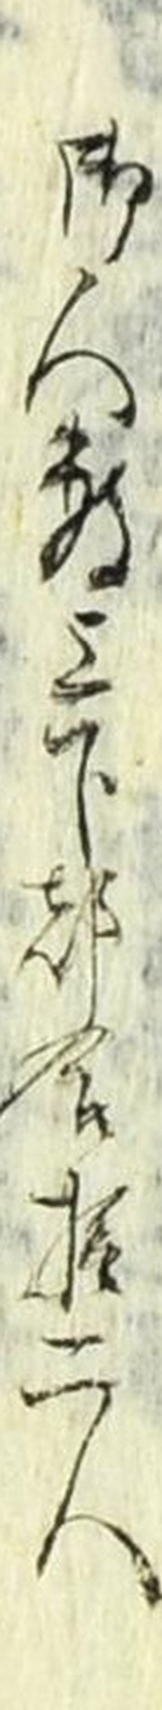御人数上下都合拾二人
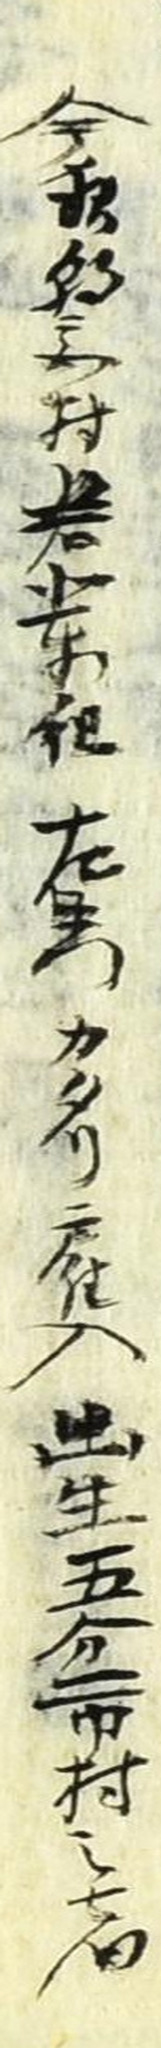今夜朝宮村若輩組左衛門カタリ雇入出生五分市村之者
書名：（日記）
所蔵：福井県文書館 Fukui Prefectural Archives
